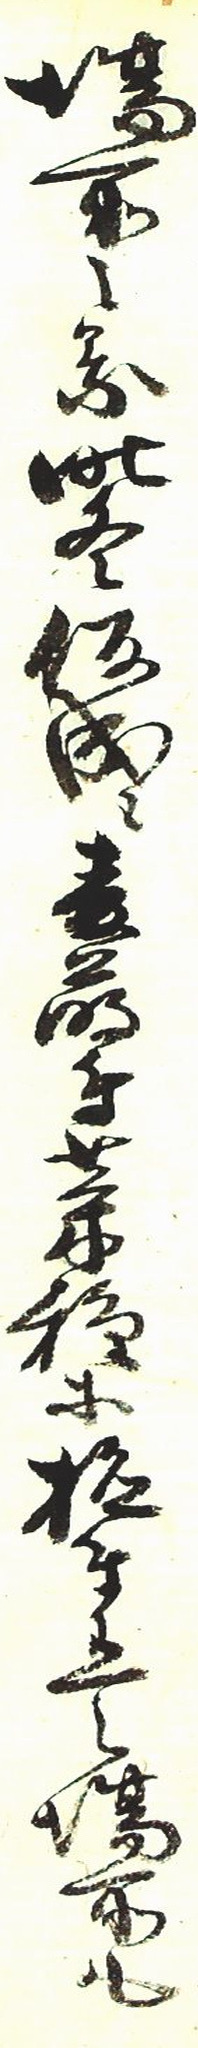場所之義昨冬仮成に麦蒔付菜種等植付有之場所も
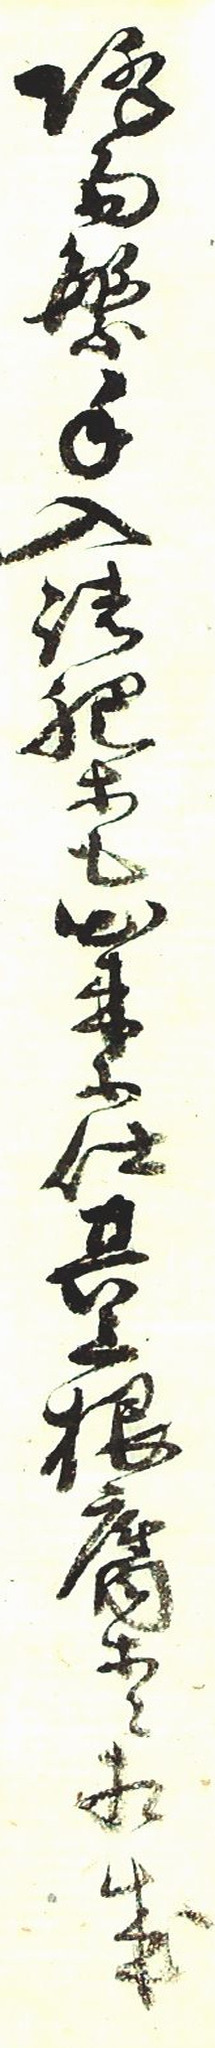降雨繁手入諸肥等も出来不仕其上根腐等と相成
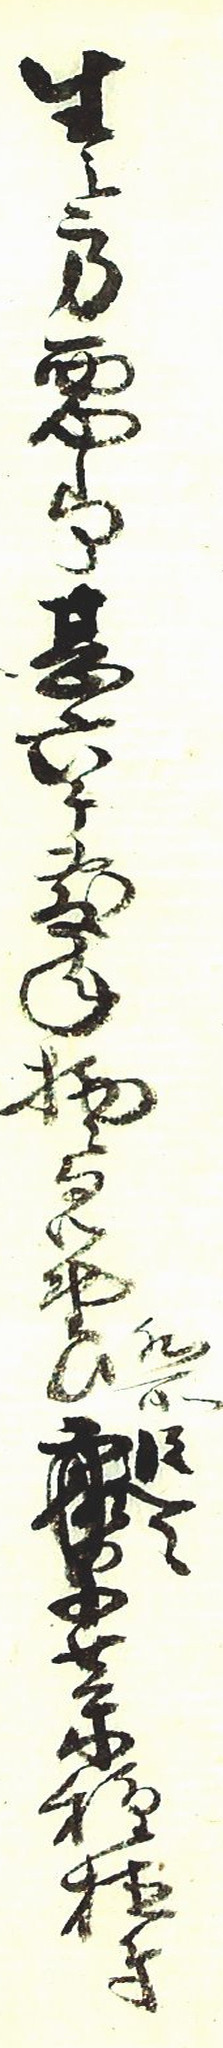生し方悪布甚六ヶ敷年柄にて御座候然所追々菜種植付
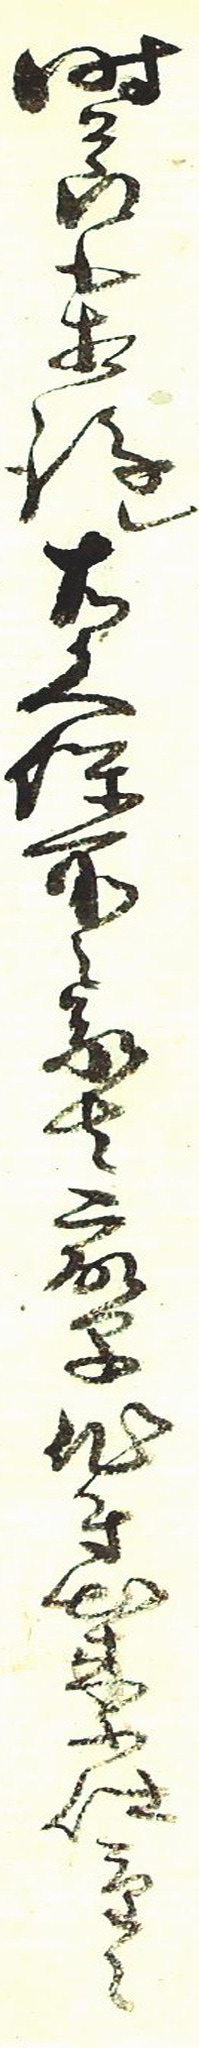時節も相後れ右久保所之義は最早作付出来不仕重々
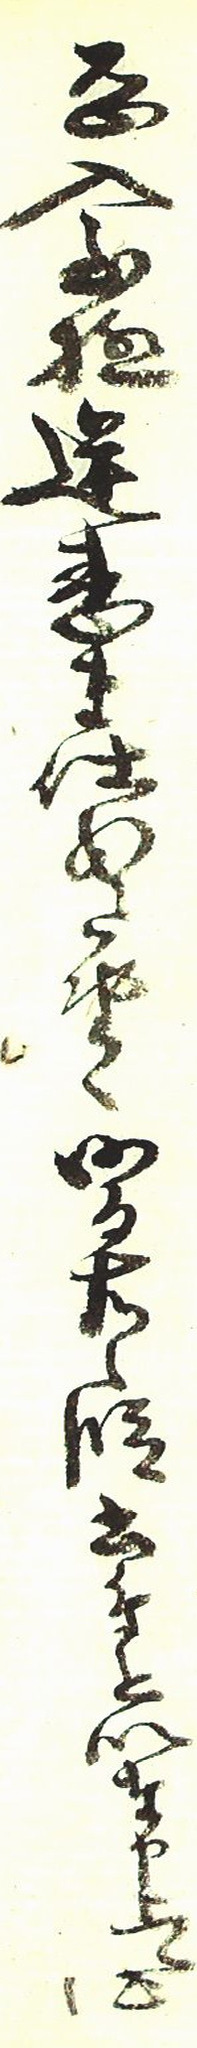恐入至極迷惑奉仕義に御座候仍て右之段書付を以奉申上候以上
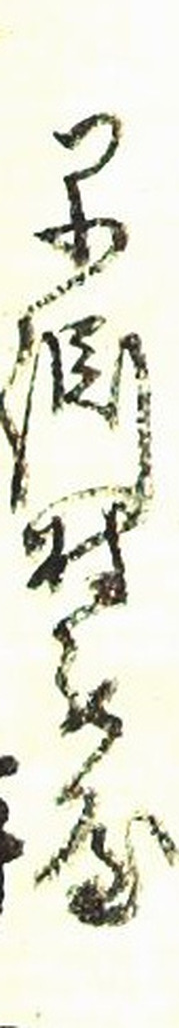早淵村庄屋
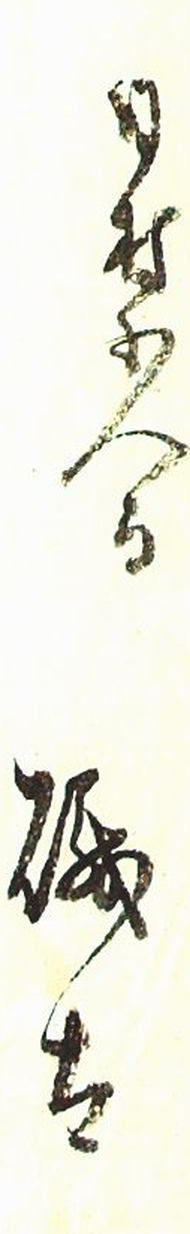同村五人与磯太
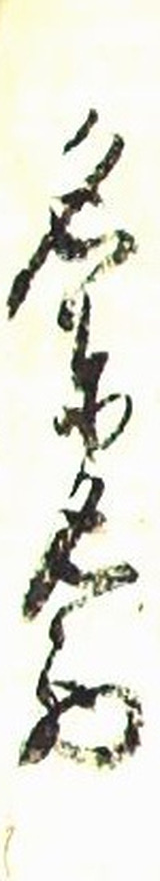名東名西
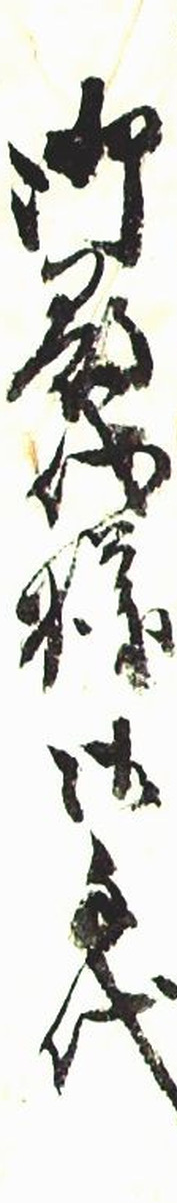御郡代様御手代
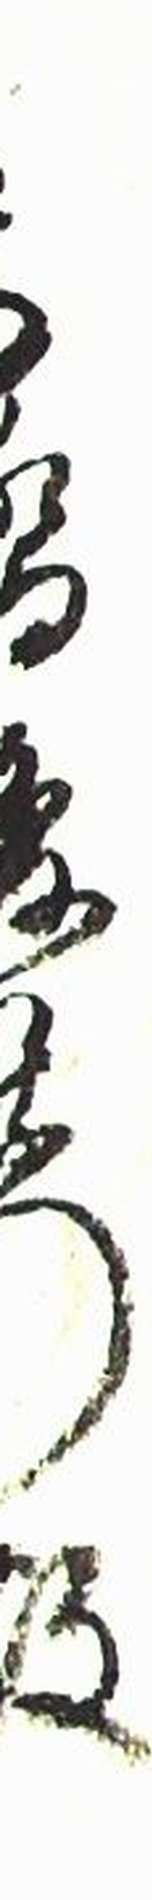高橋俊左衛門殿

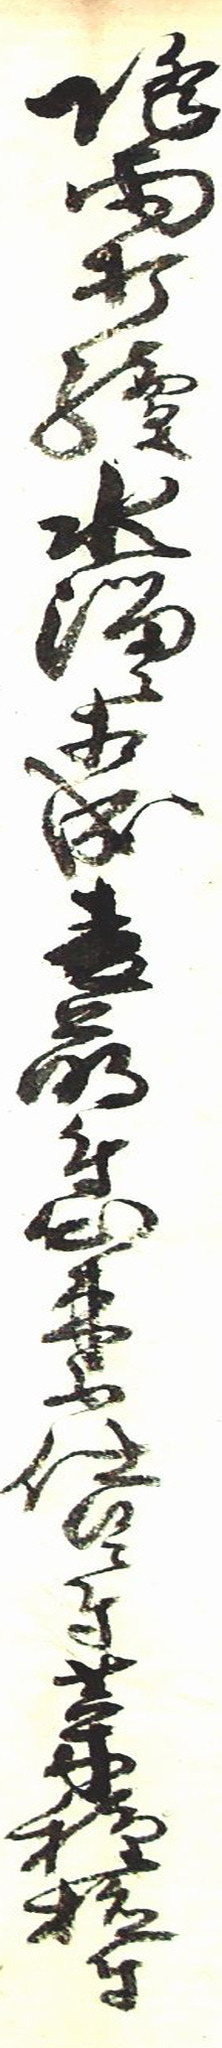降雨打続水溜に相成麦蒔付出来不仕候に付菜種植付
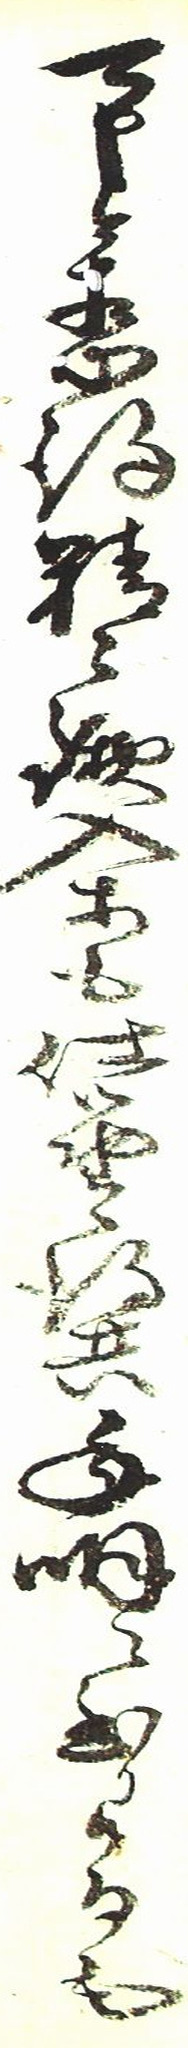可申と相心得精々鍬入等も仕御座候得共手明に至り候ても
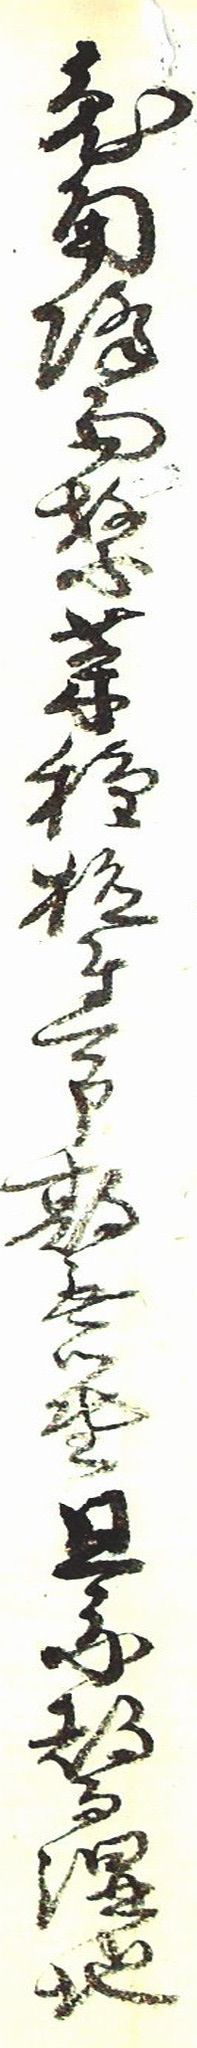兎角降雨繁菜種植付可申期無御座候且亦都て湿地
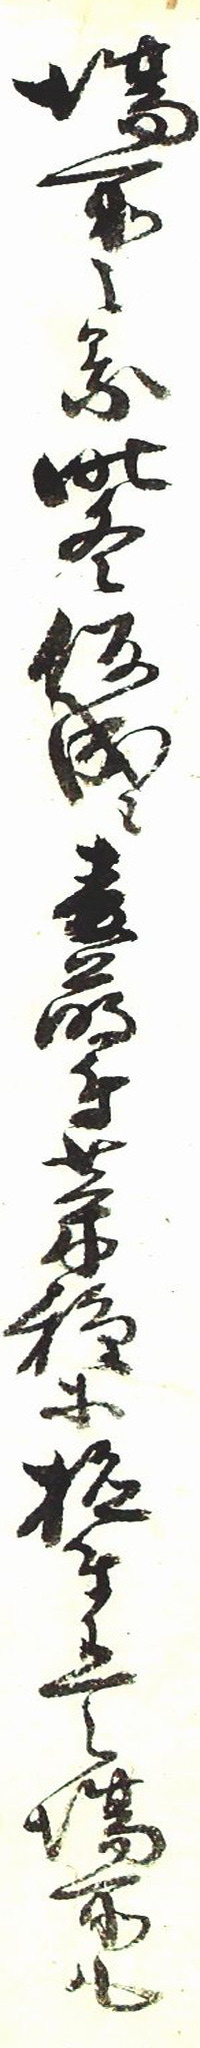場所之義昨冬仮成に麦蒔付菜種等植付有之場所も
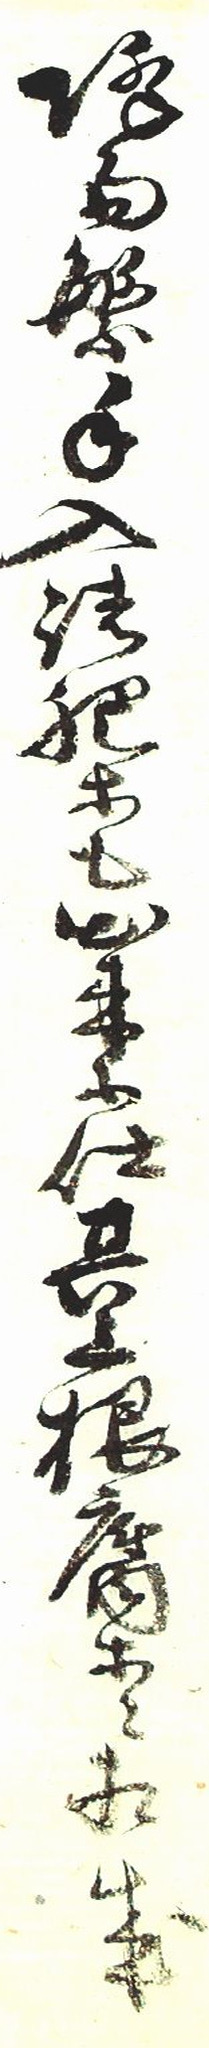降雨繁手入諸肥等も出来不仕其上根腐等と相成
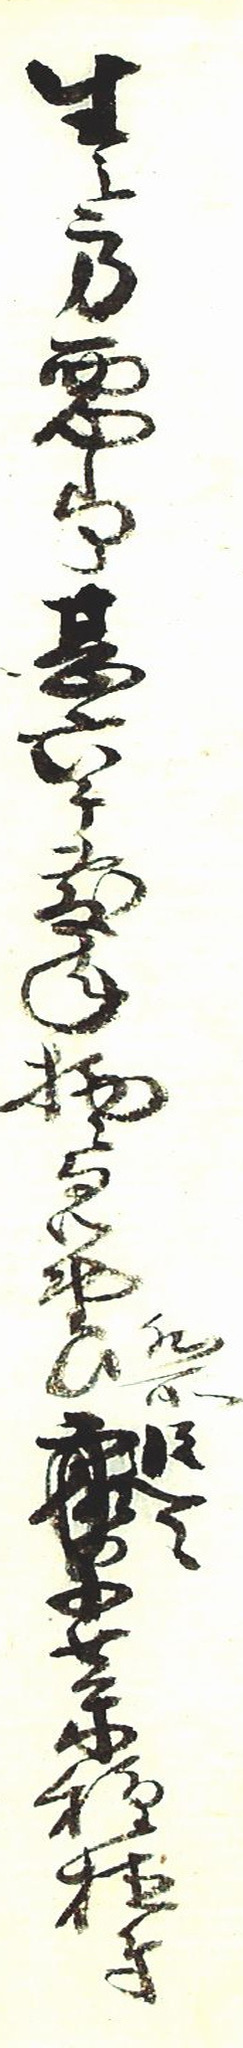生し方悪布甚六ヶ敷年柄にて御座候然所追々菜種植付
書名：諸御願書控(弐番）
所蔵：鳴門教育大学 Naruto University of Education
